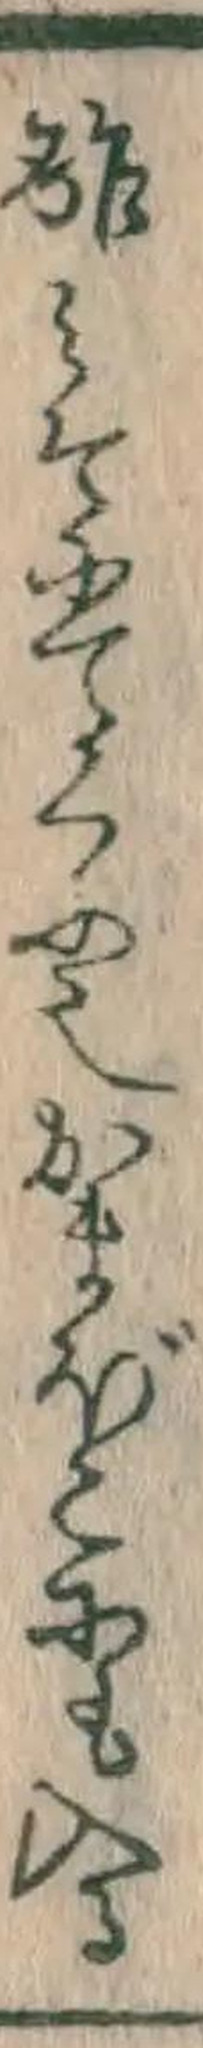酢みそにてくふ也かまぼこにも入る
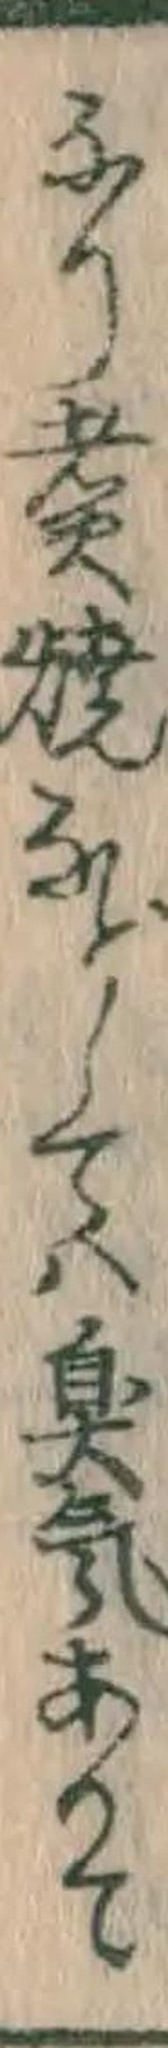なり煮焼などしては臭気ありて
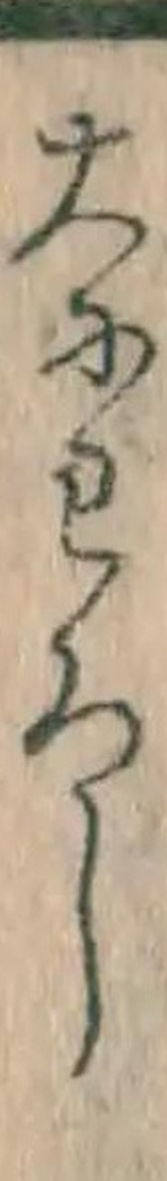大にわろし
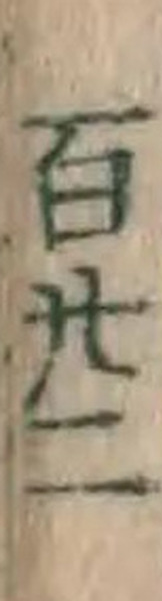百廿二

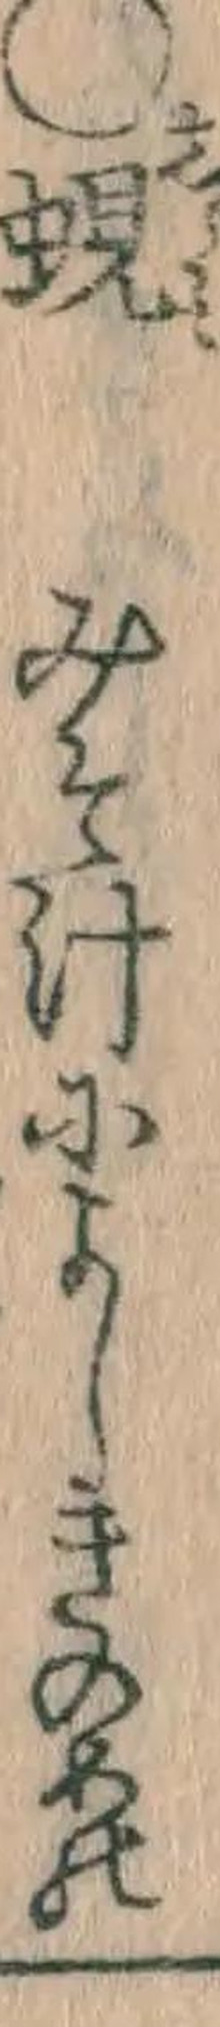○蜆みそ汁によしきのめの
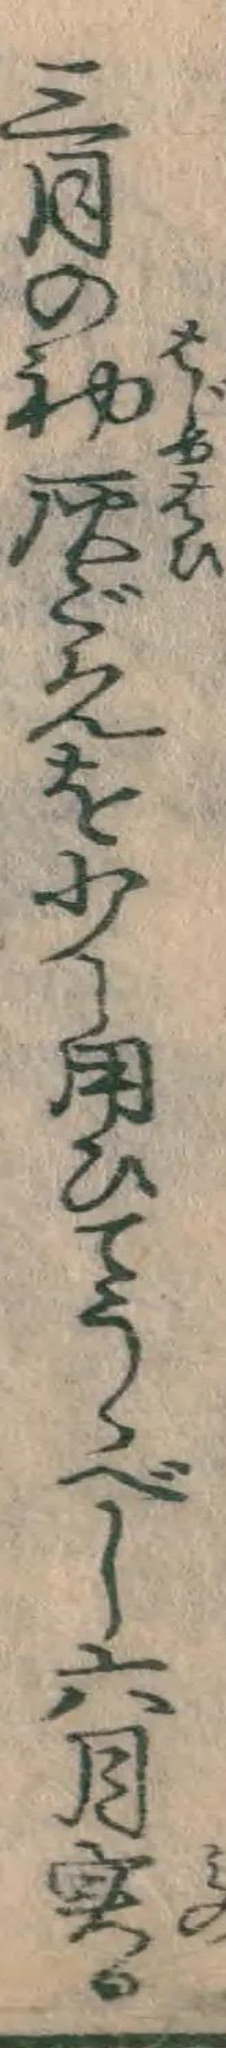三月の初灰ごえを少し用ひてうゝべし六月実る
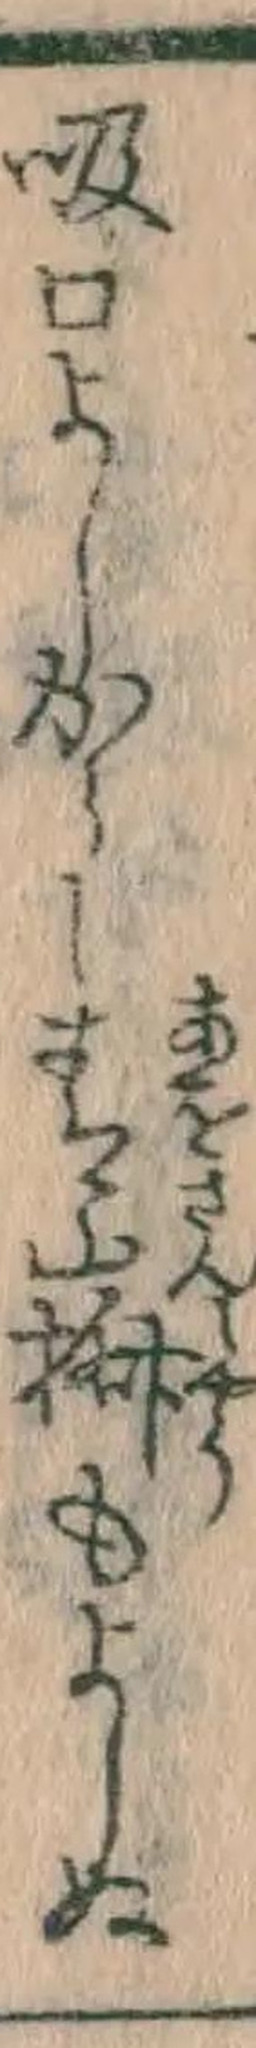吸口よしからし青山枡もよしぬ
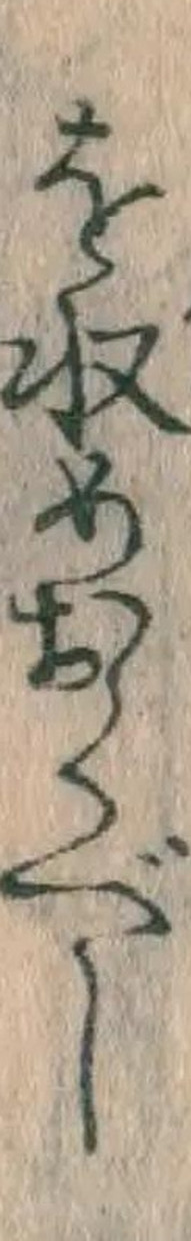を収めおくべし
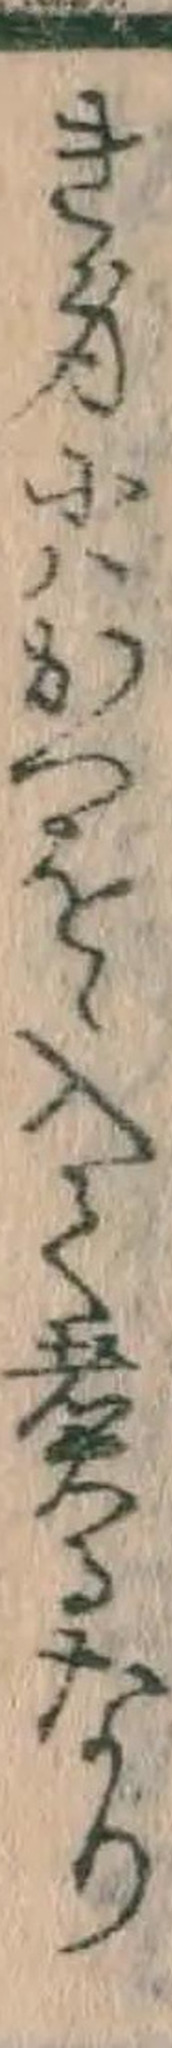き身にはかつをゝ入て煮るなり
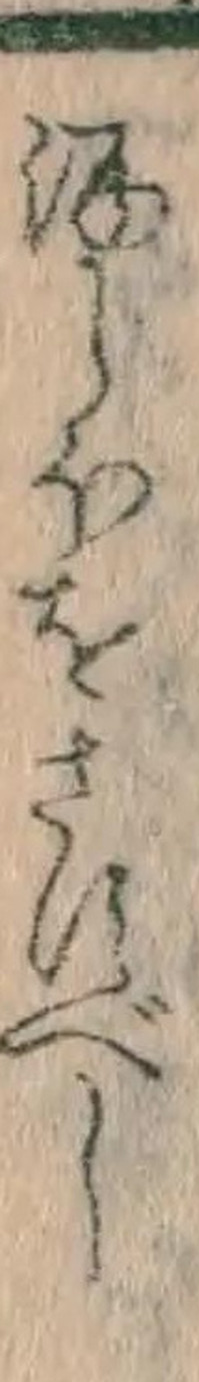酒しほをさすべし
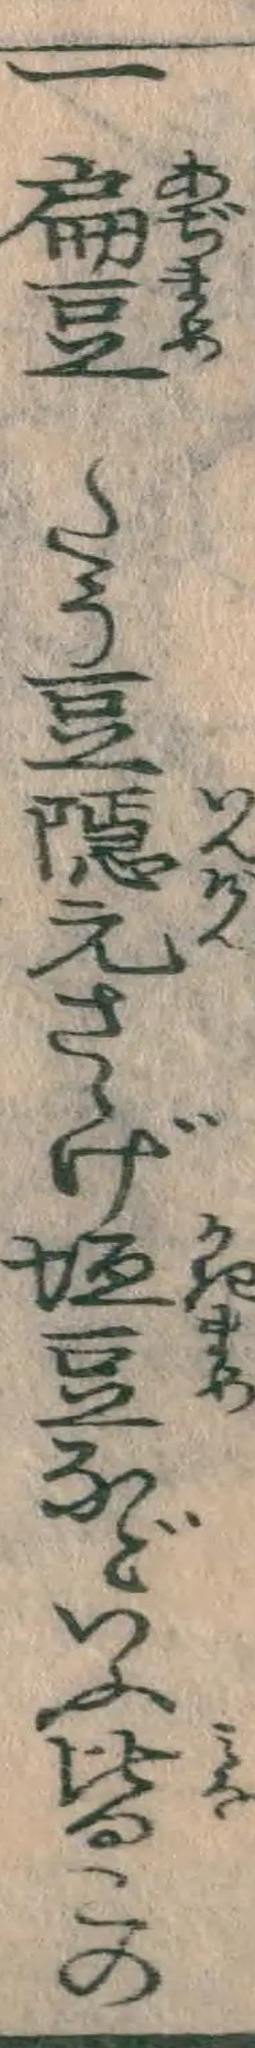一扁豆たう豆隠元さゝげ垣豆などいふ皆この
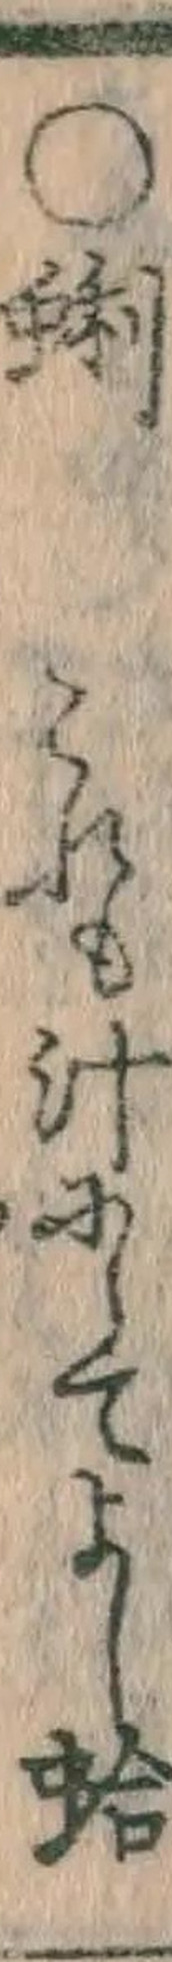○蜊これも汁にしてよし蛤
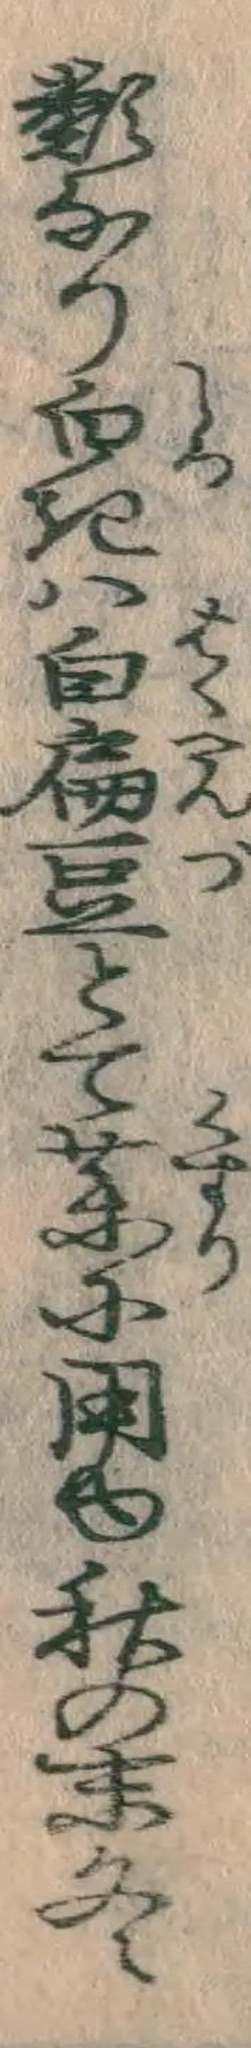類なり白きは白扁豆とて薬に用ゆ秋の末冬
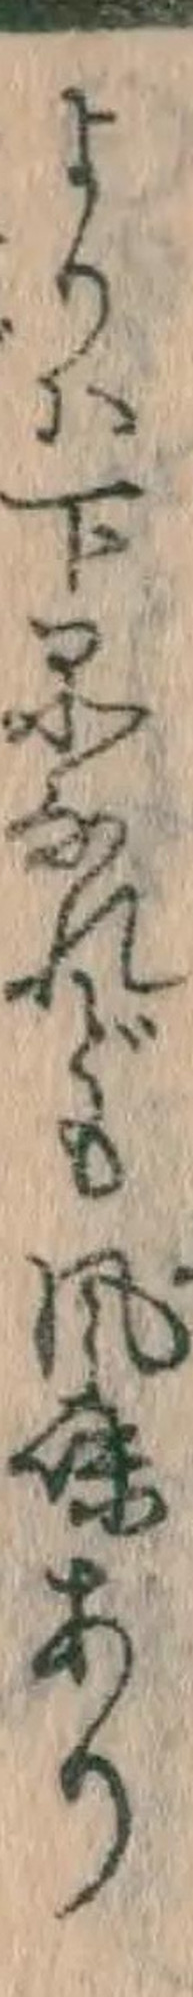よりは下品なれども風味あり
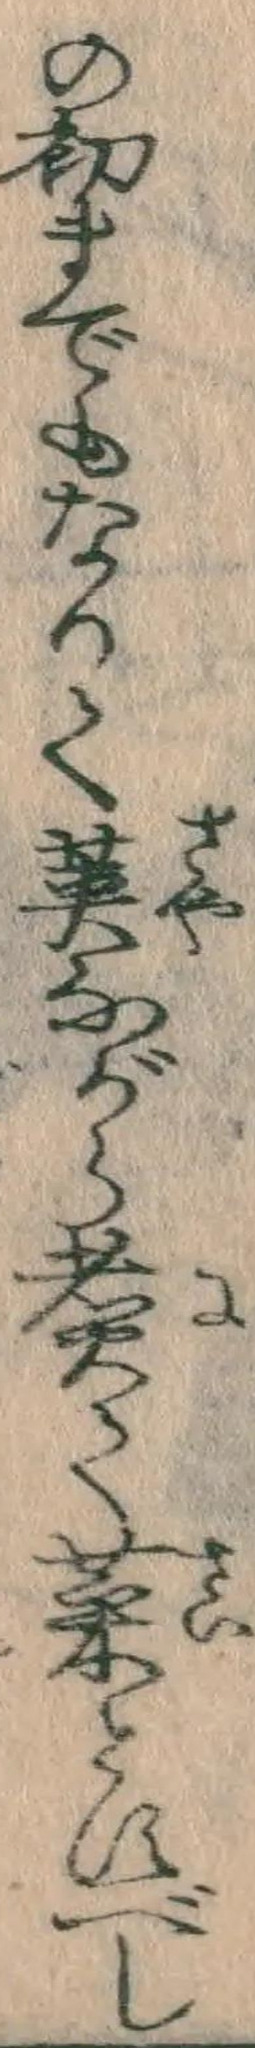の初までもなりて莢ながら煮て菜とすべし
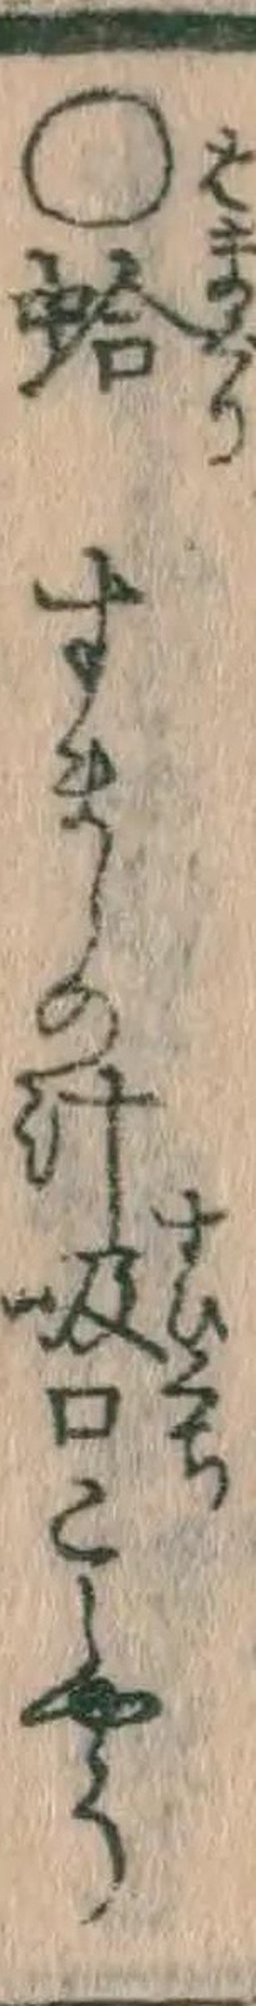○蛤すましの汁吸口こしやう
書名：広益秘事大全 3巻. [5]
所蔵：国立国会図書館 National Diet Library, JAPAN
